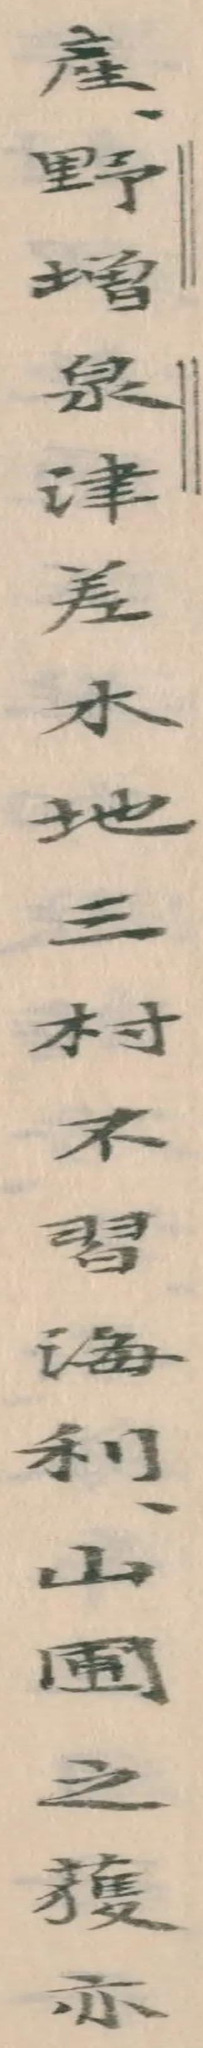産、野増泉津差木地三村不習海利、山圃之獲亦
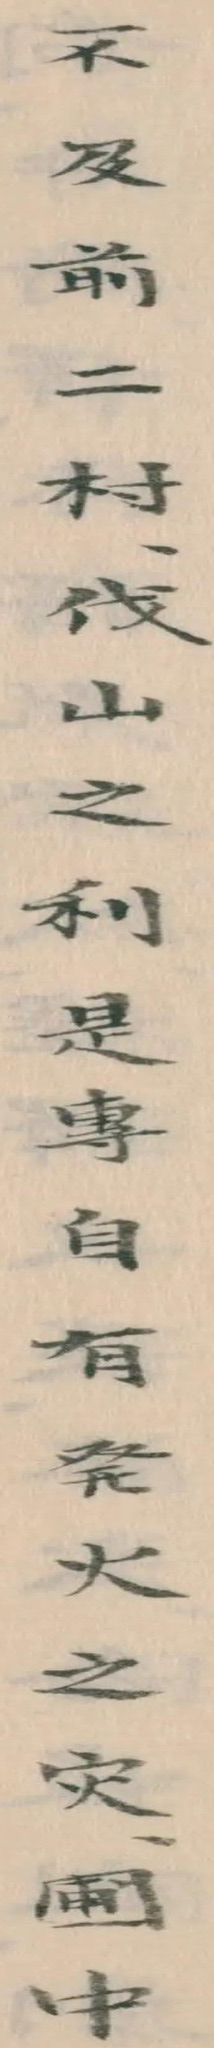不及前二村、伐山之利是専自有発火之灾、圃中
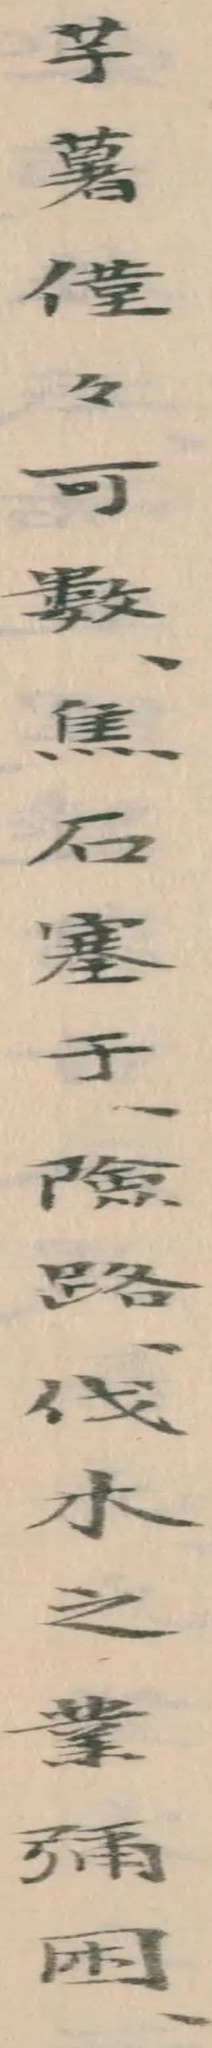芋薯僅々可数、焦石塞于、険路、伐木之業弥困、
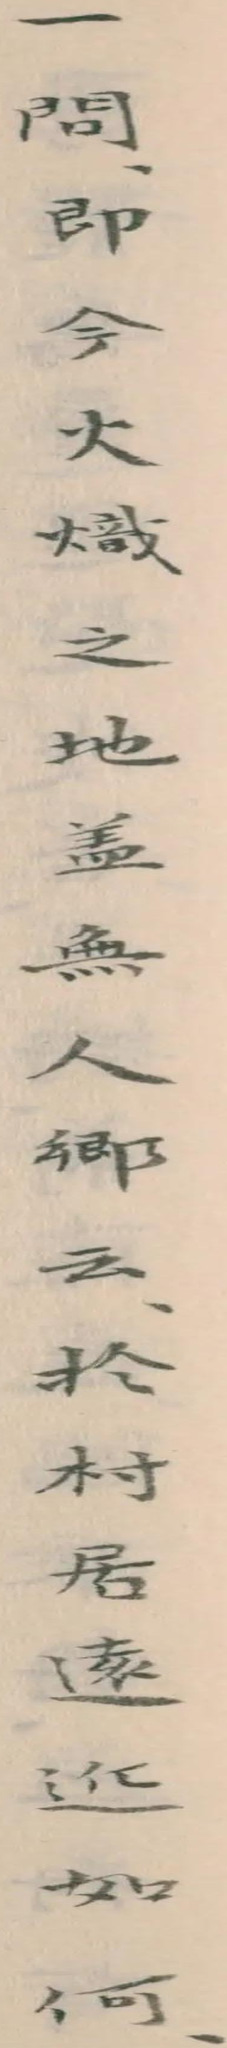一問、即今火熾之地蓋無人郷云、於村居遠近如何、
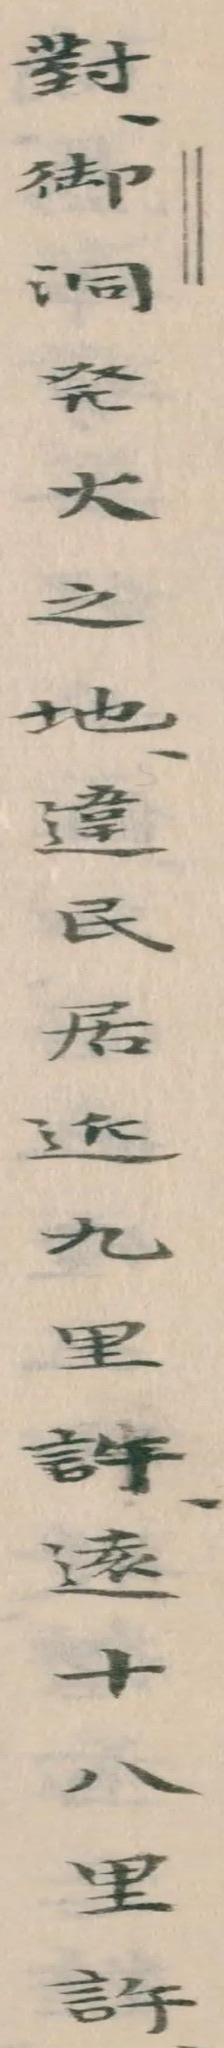対、御洞発火之地、違民居近九里許、遠十八里許、
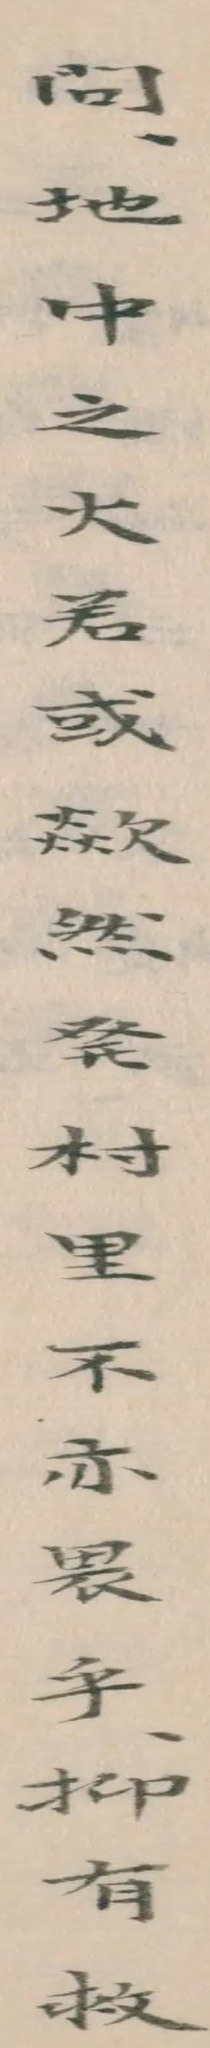一問、地中之火若或歘然発村里不亦畏乎、抑有救
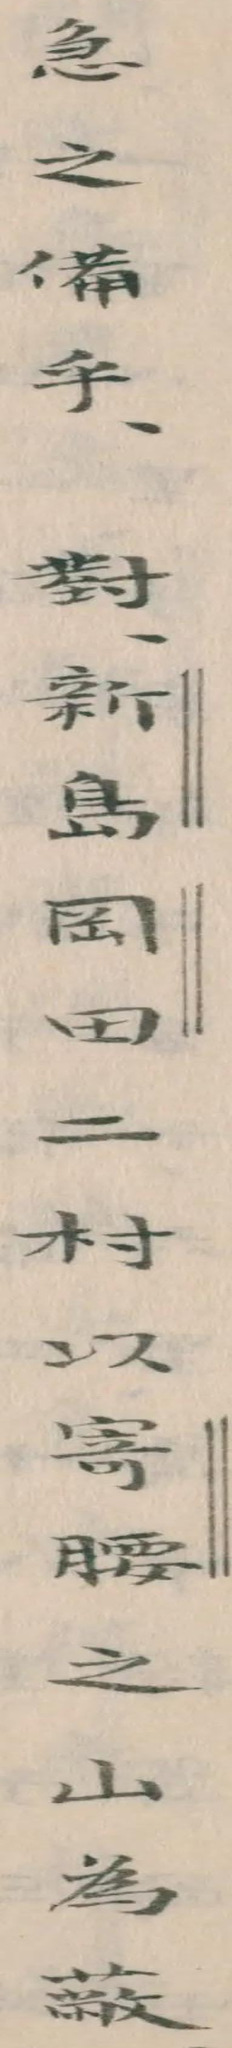急之備乎、対、新島岡田二村以寄腰之山為蔽、
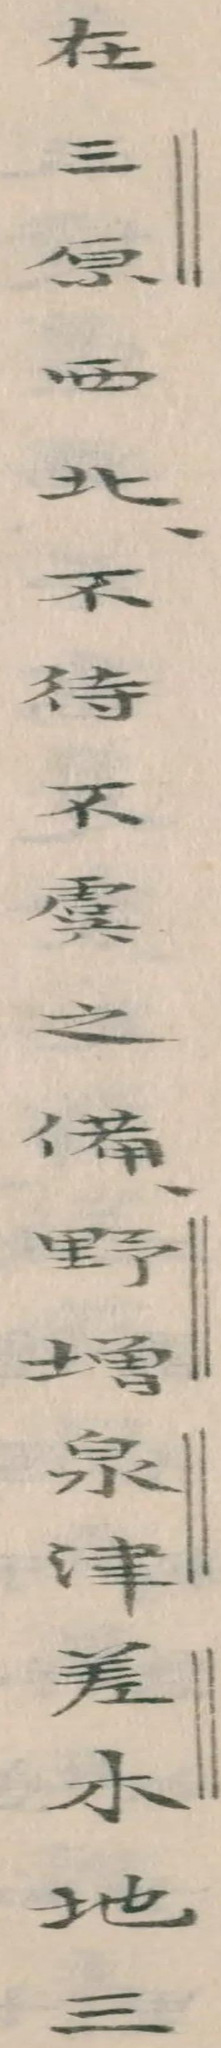在三原西北、不待不虞之備、野増泉津差木地三
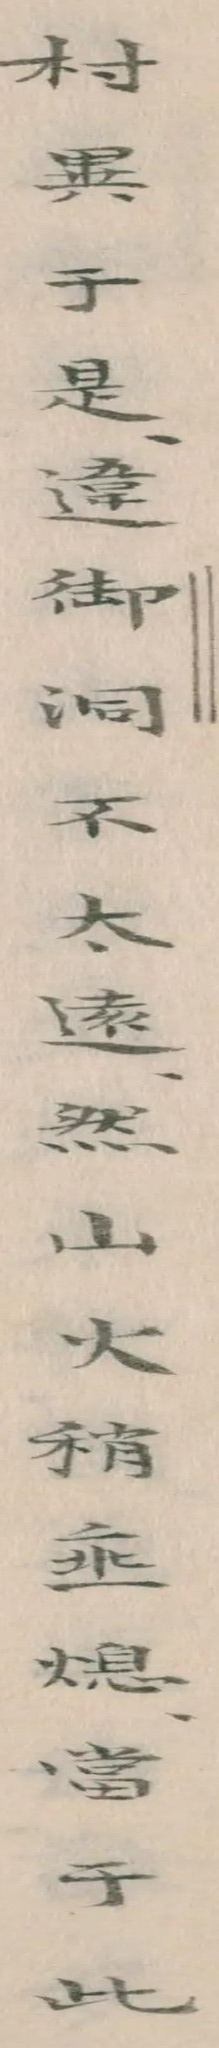村異于是、違御洞不太遠、然山火稍乖熄、当于此
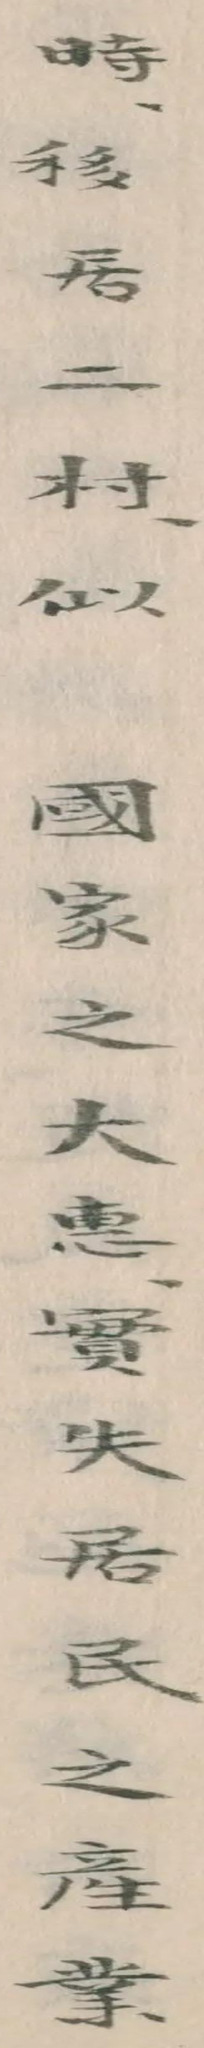時、移居二村、似国家之大恵、実失居民之産業
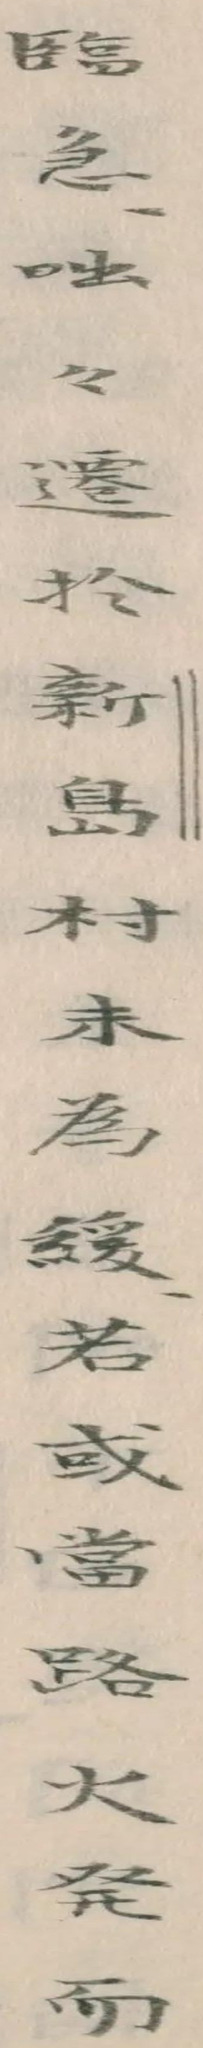臨急、咄々遷於新島村未為緩、若或当路火発而
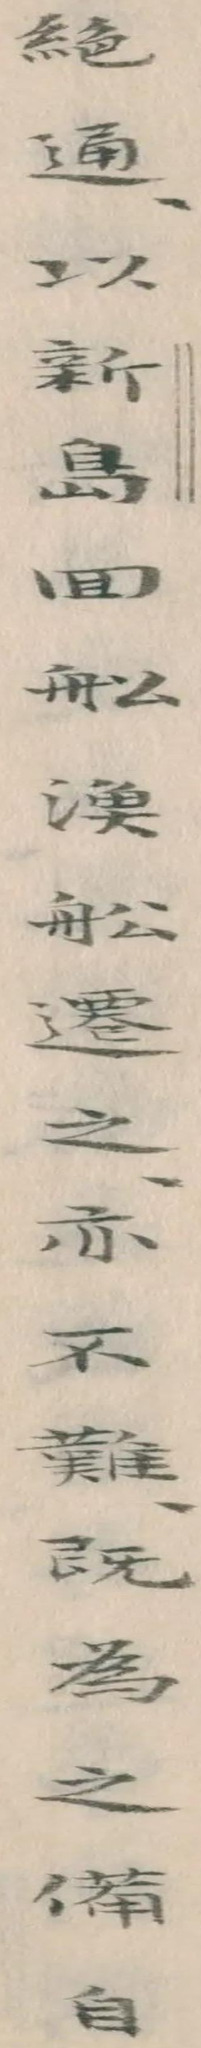絶道、以新島回船漁船遷之、亦不難、既為之備自
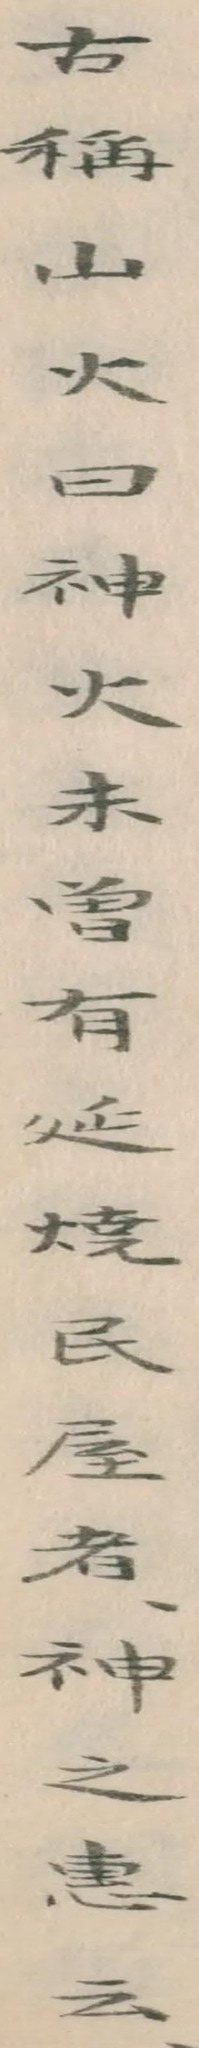古称山火曰神火未曽有延焼民屋者、神之恵云、

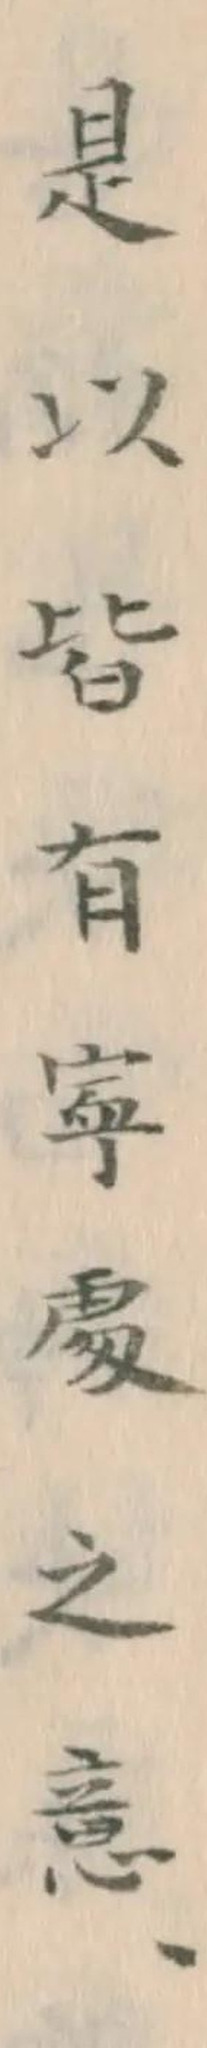是以皆有年寧処之意、
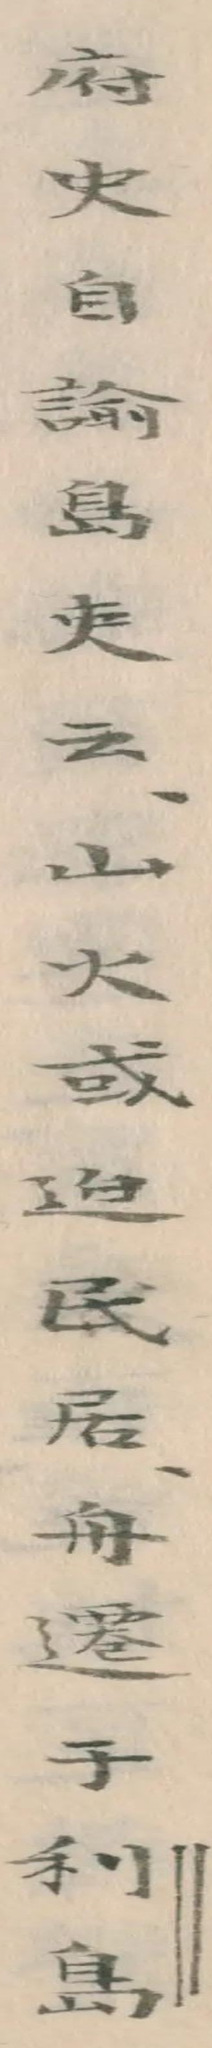府史自諭島吏云、山火或迫民居、舟遷于利島
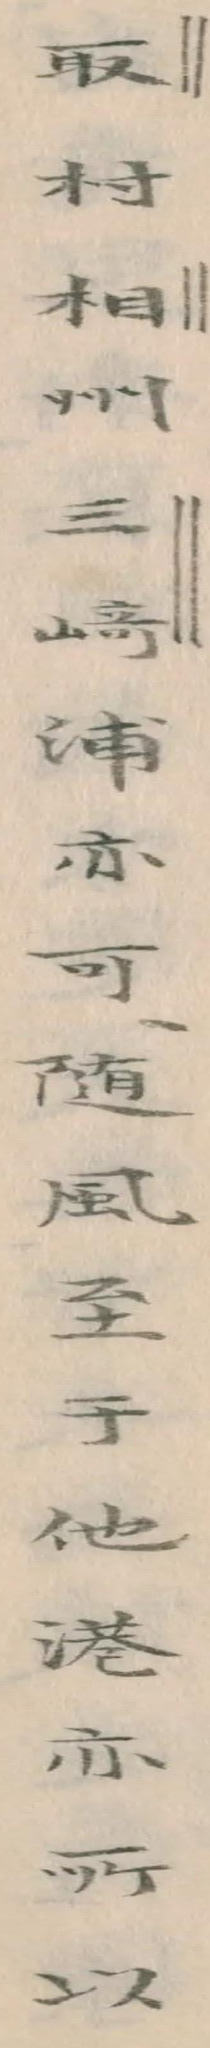取村相州三崎浦亦可、随風至于他港亦所以
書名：地災撮要. 巻11-12(地震之部)
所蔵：国立国会図書館 National Diet Library, JAPAN
